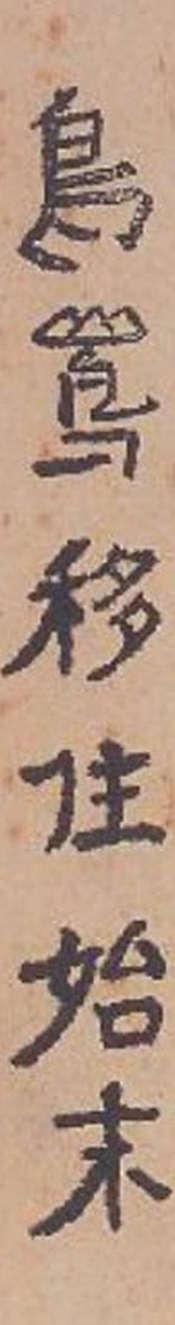鳥島移住始末

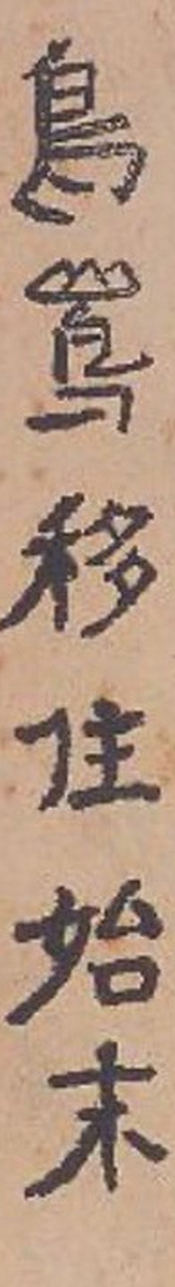鳥島移住始末

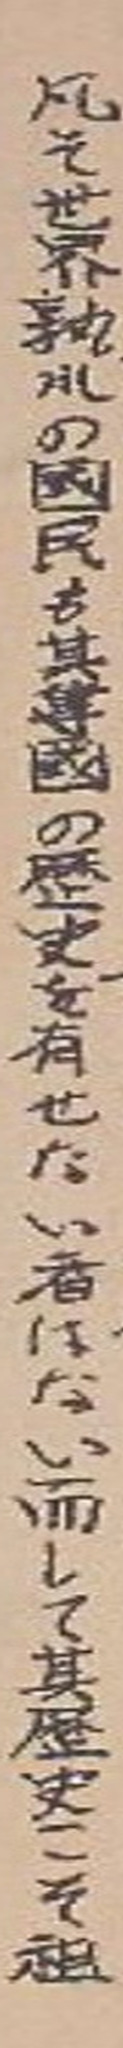凡そ世界孰れの国民も其建国の歴史を有せない者はない而して其歴史こそ祖
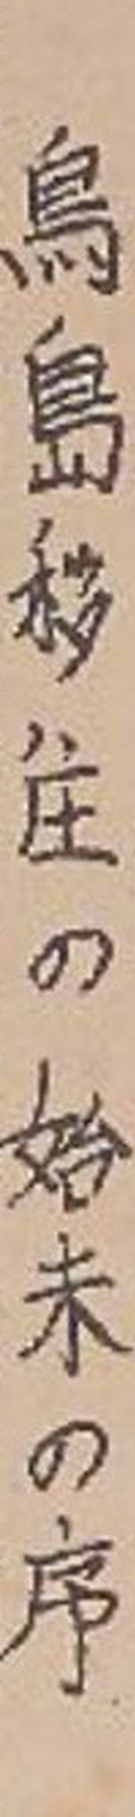鳥島移住の始末の序
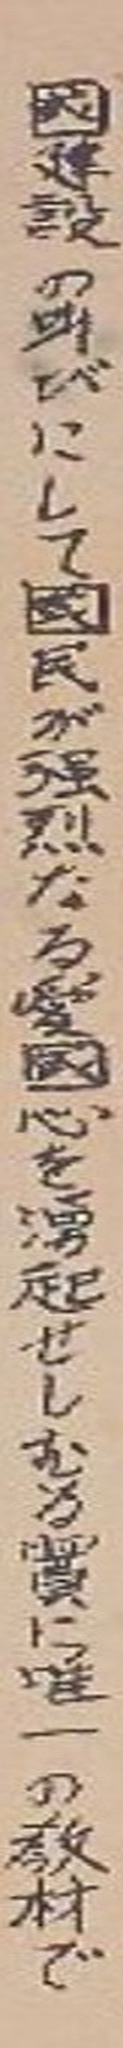国建設の叫びにして国民が強烈なる愛国心を湧起せしむる実に唯一の教材で
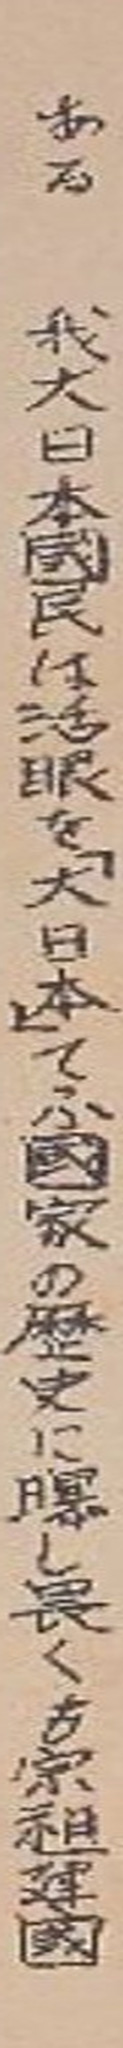ある我大日本国民は活眼を「大日本」てふ国家の歴史に曝し畏くも宗祖建国
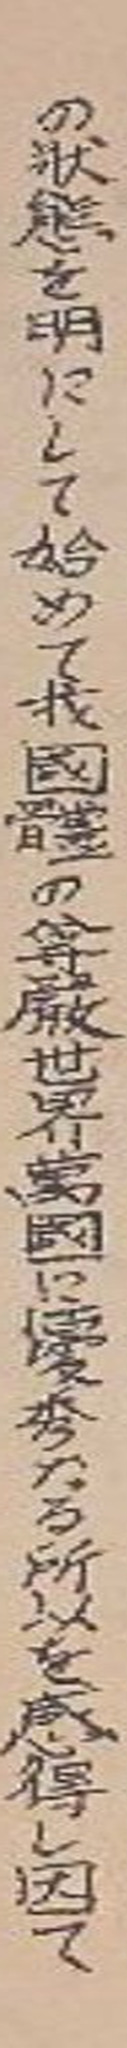の状態を明にして始めて我国体の尊厳世界万国に優秀なる所以を感得し因て
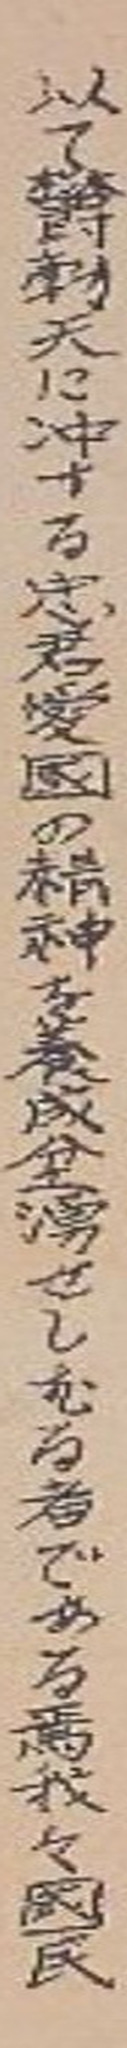以て鬱勃天に冲する忠君愛国の精神を養成坌湧せしむる者である焉我々国民
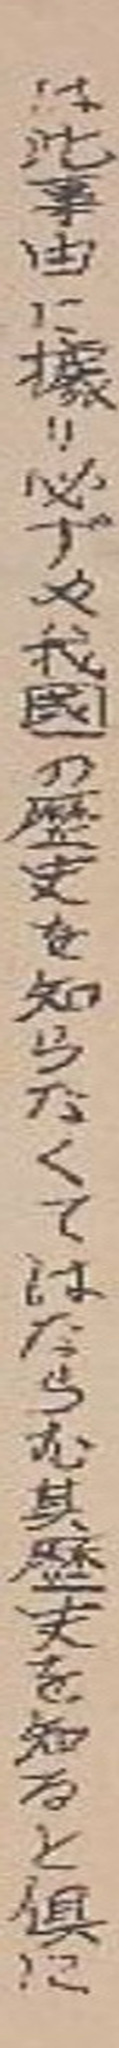は此事由に拠り必ずや我国の歴史を知らなくてはならむ其歴史を知ると倶に
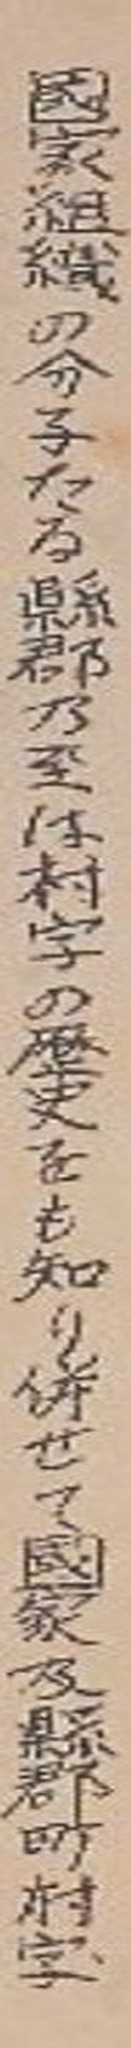国家組織の分子たる県郡乃至は村字の歴史をも知り併せて国家及県郡町村字
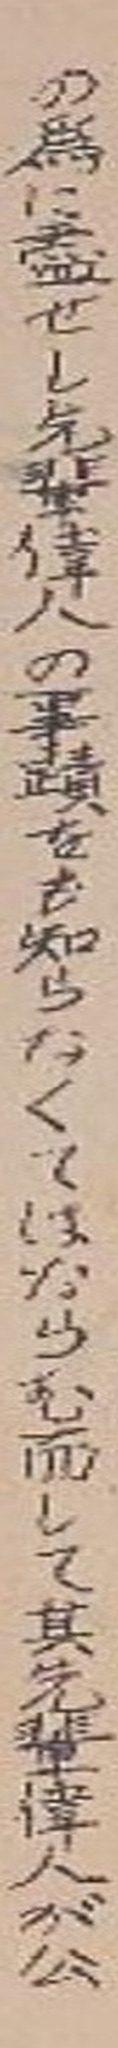の為に尽せし先輩偉人の事蹟をも知らなくてはならむ而して其先輩偉人が公
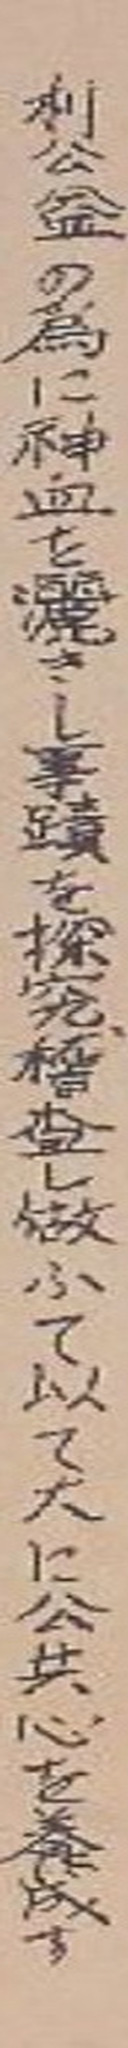利公益の為に神血を灑きし事蹟を探究稽査し做ふて以て大に公共心を養成す
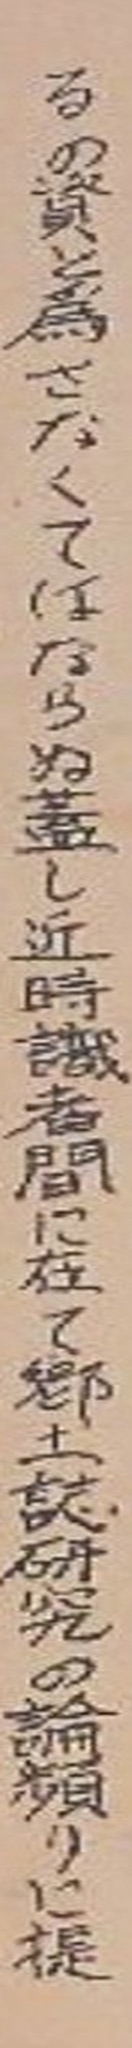るの資と為さなくてはならぬ蓋し近時識者間に在て郷土誌研究の論頻りに提
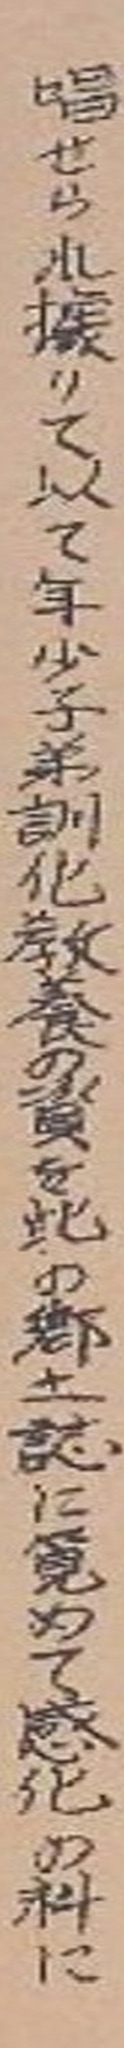唱せられ拠りて以て年少子弟訓化教養の資を此の郷土誌に覓めて感化の料に

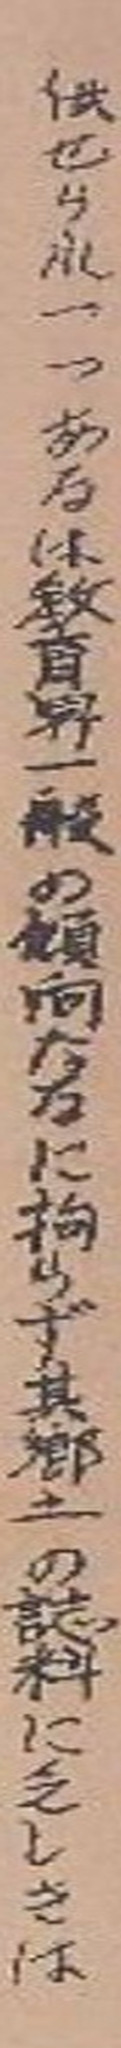供せられつつあるは教育界一般の傾向なるに拘らず其郷土の誌料に乏しきは
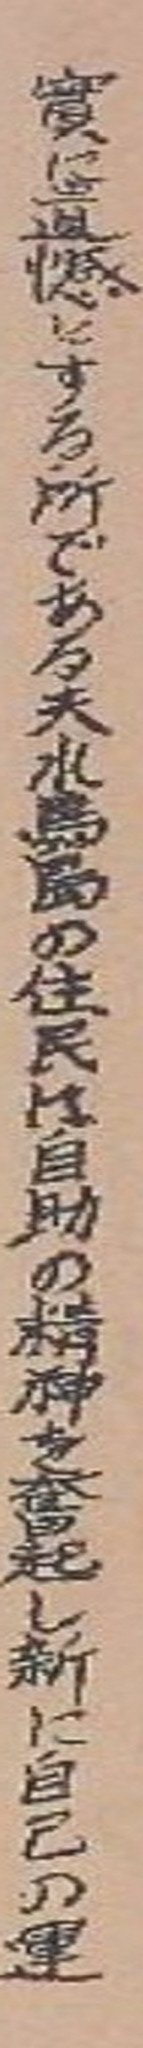実に遺憾とする所である夫れ鳥島の住民は自助の精神を奮起し新に自己の運
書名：鳥島移住始末
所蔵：University of the Ryukyus Library
